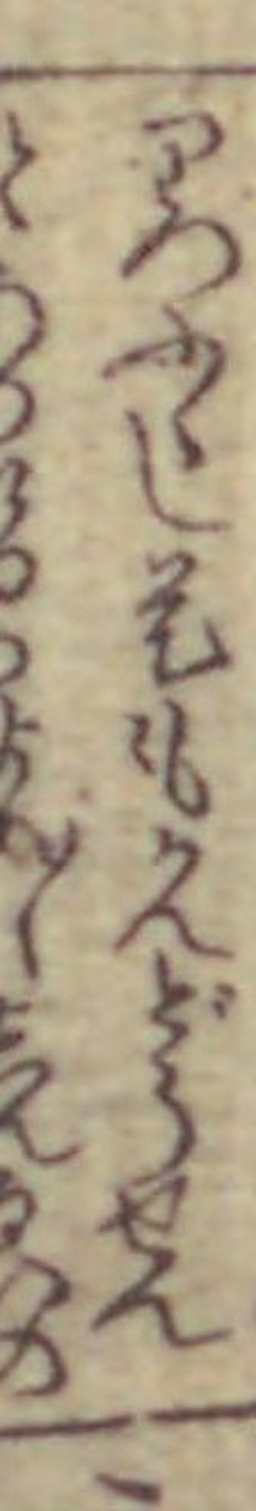とありけるがよふ〳〵しんるいの
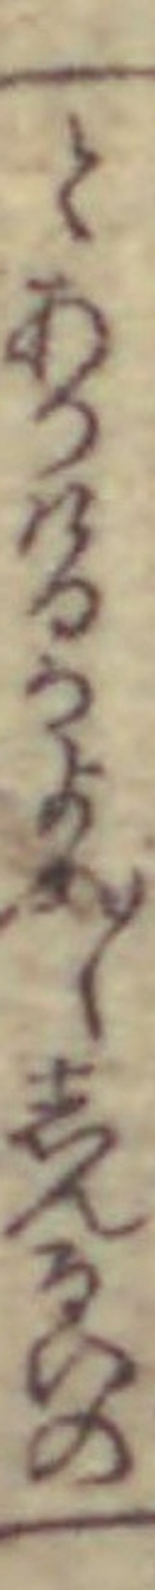とありけるがよふ〳〵しんるいの
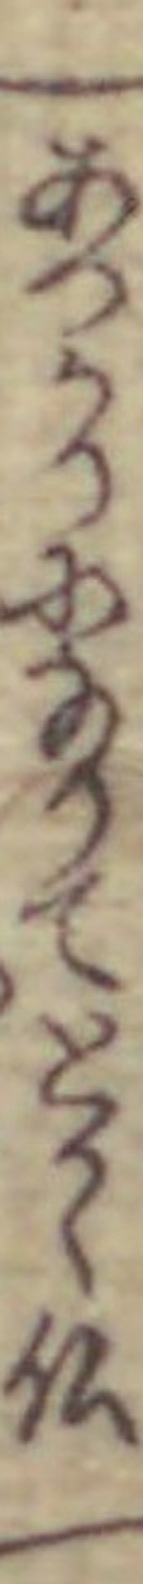あつかりになりてとかく仏
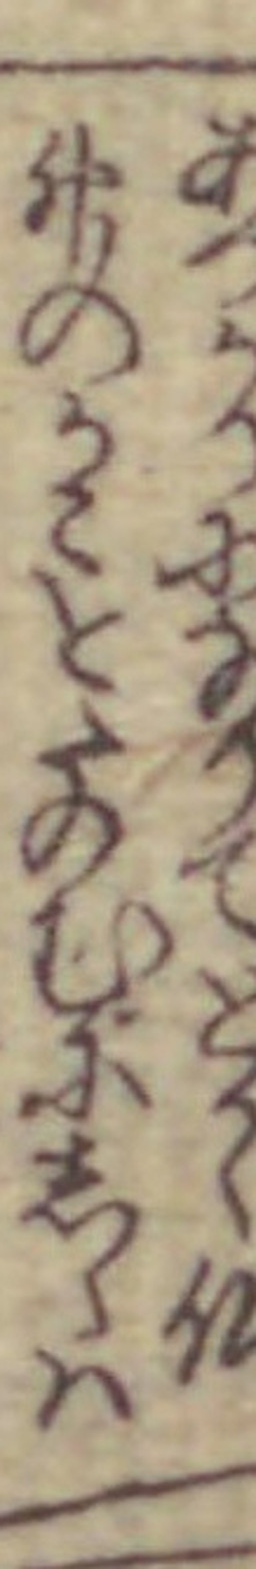神のかこをたのむにしくは
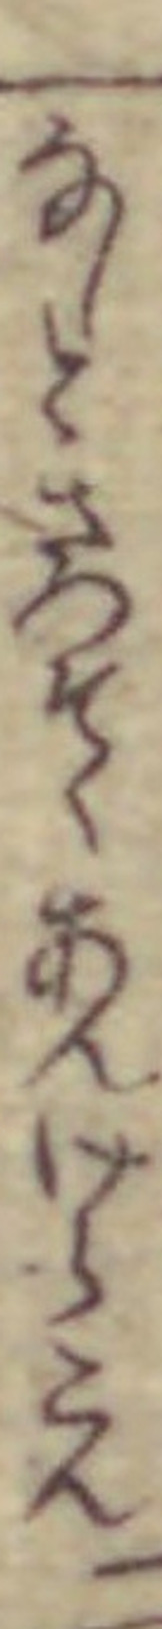なしとさつそくあんけらこん
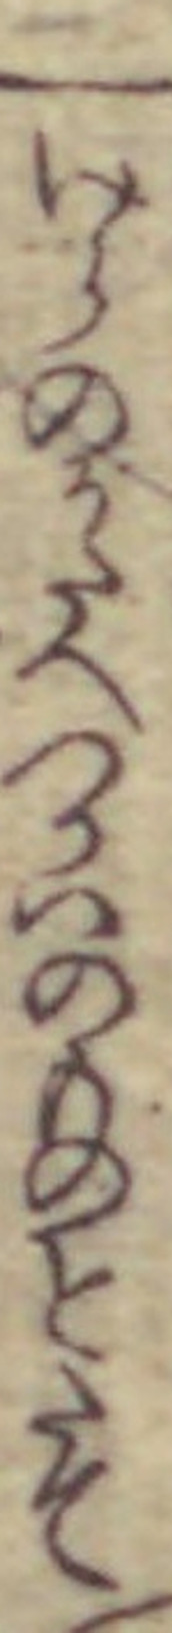けらのかたへつかいのものをたて
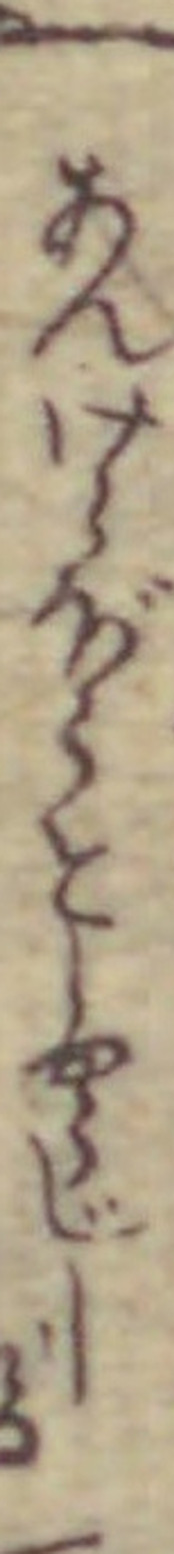あんけらぼうとしやうじける
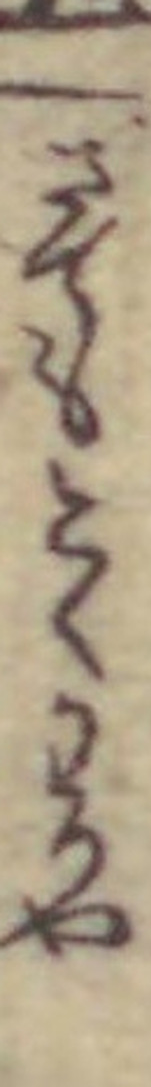さてもとくわかや
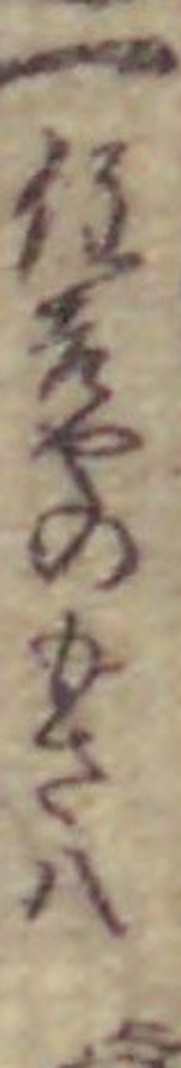住吉やのもさ八
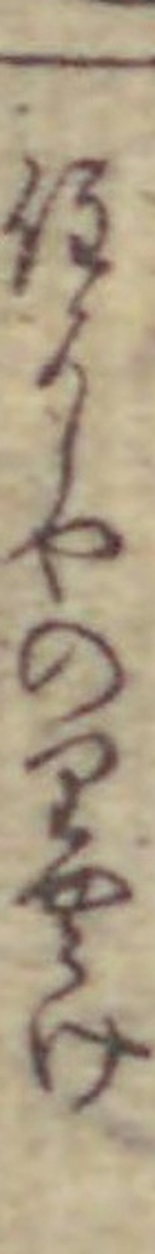住よしやのりやうけ
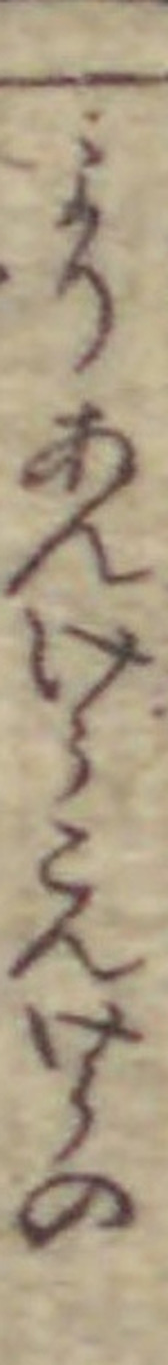よりあんけらこんけらの
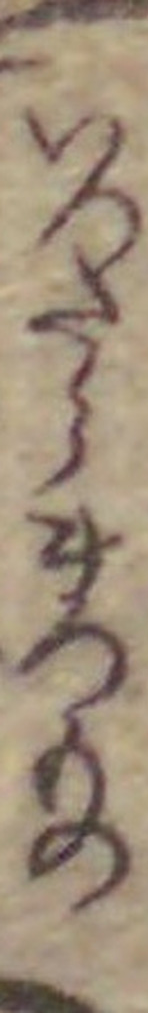いつたらまつもの
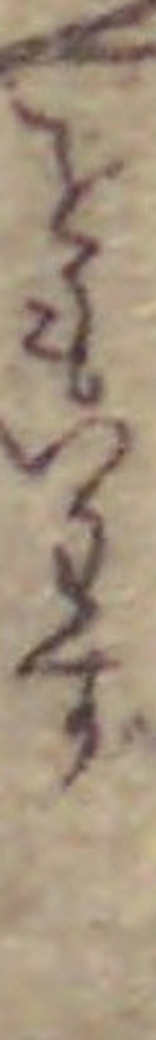をもいわず
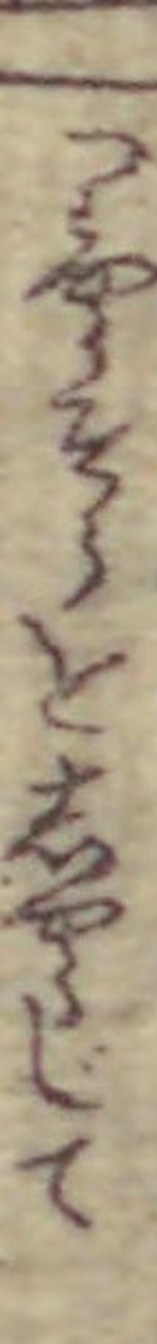りやうほうをしようじて
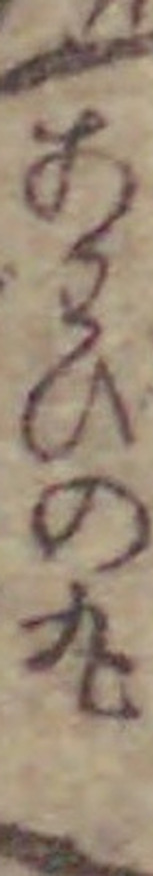あわびの丸
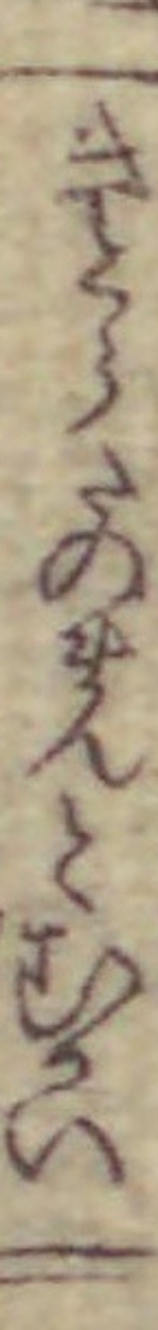きとうたのまんとむかい
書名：止而道致虚録 3巻
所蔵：国立国会図書館 National Diet Library, JAPAN
